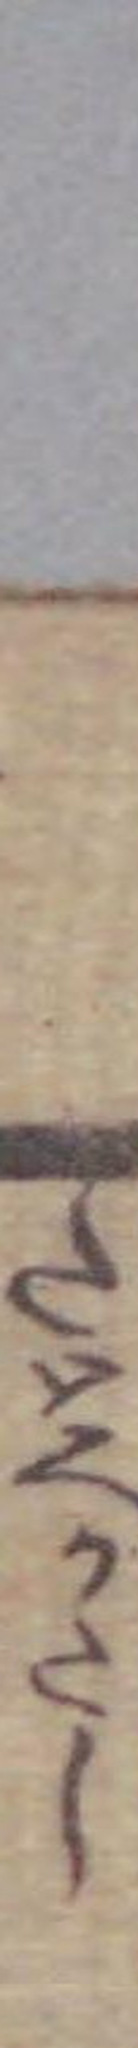たとへがたし
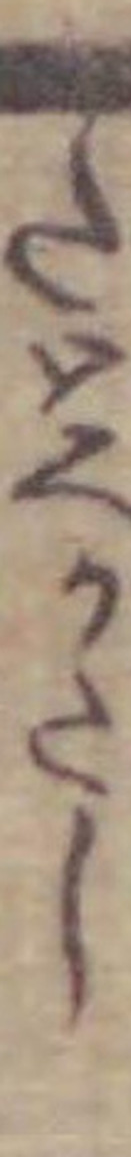たとへがたし
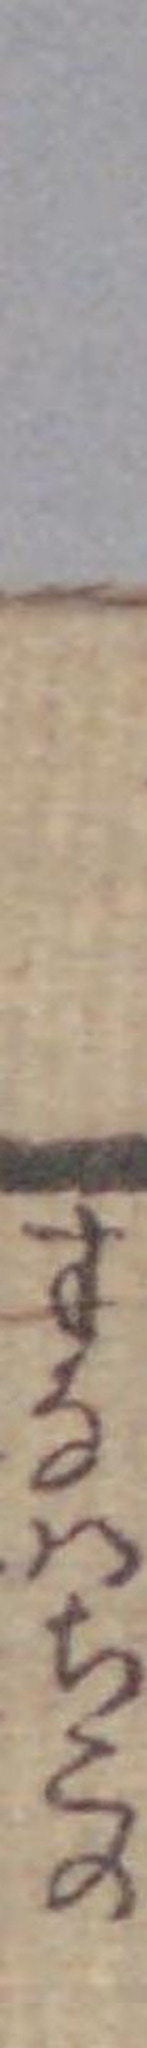すなはちこの
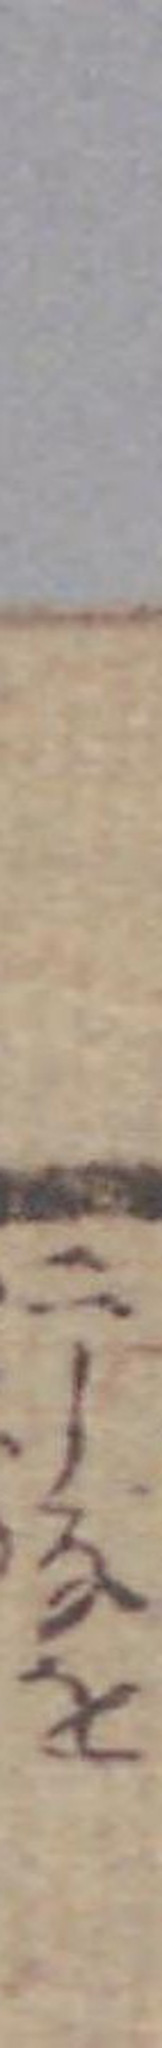二しなを
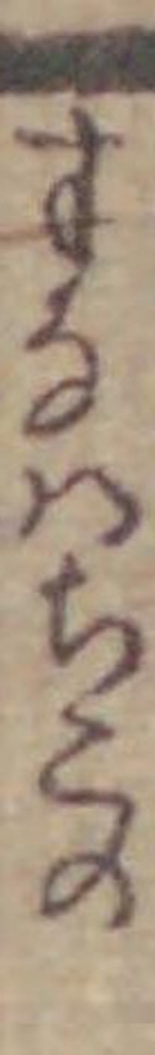すなはちこの
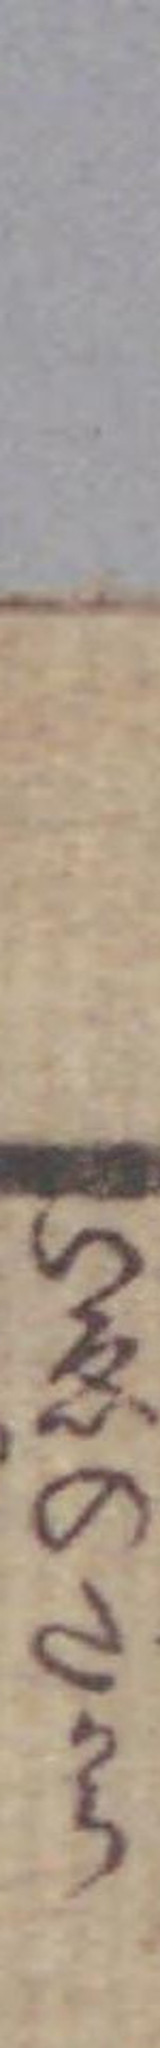いゑのたから
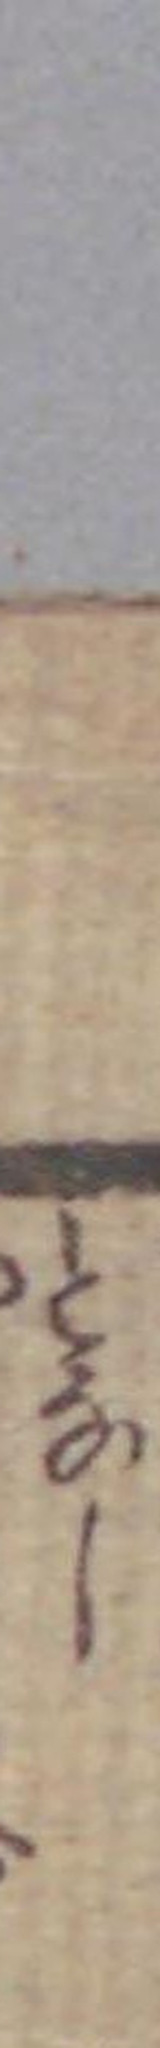となし
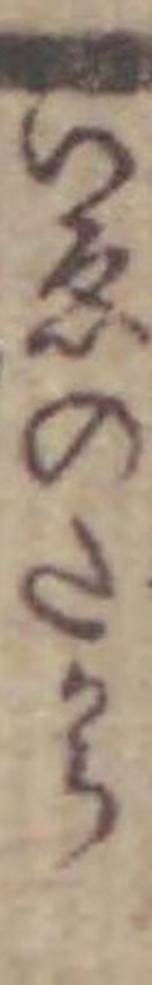いゑのたから
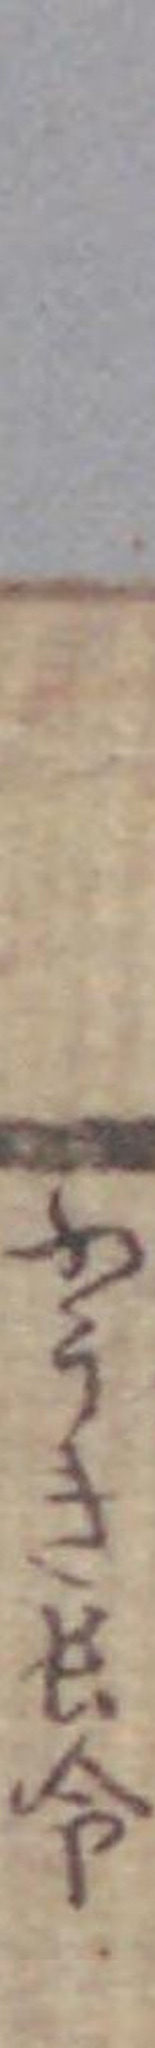ふうき長命
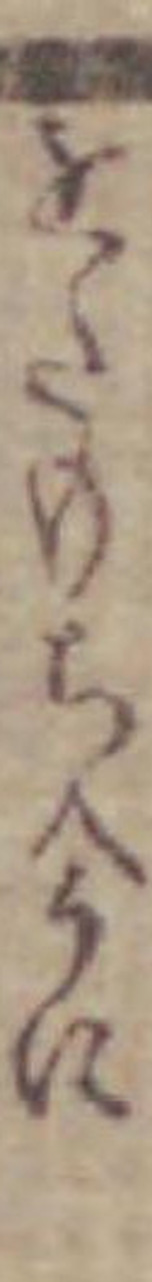をたもち今に
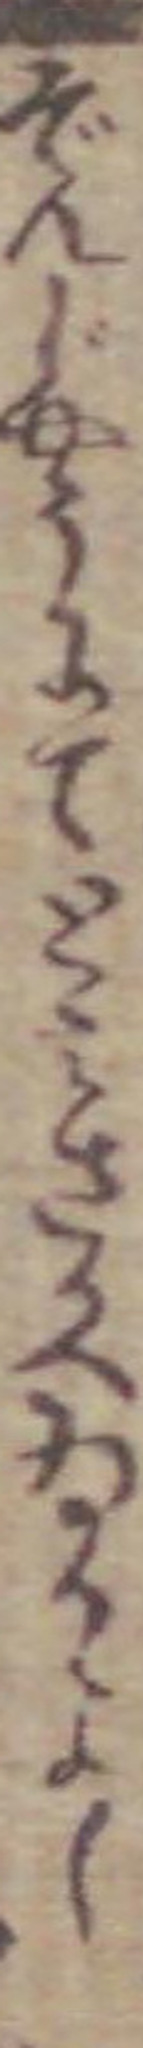ぞんじやうにてとみさかへゐるよし
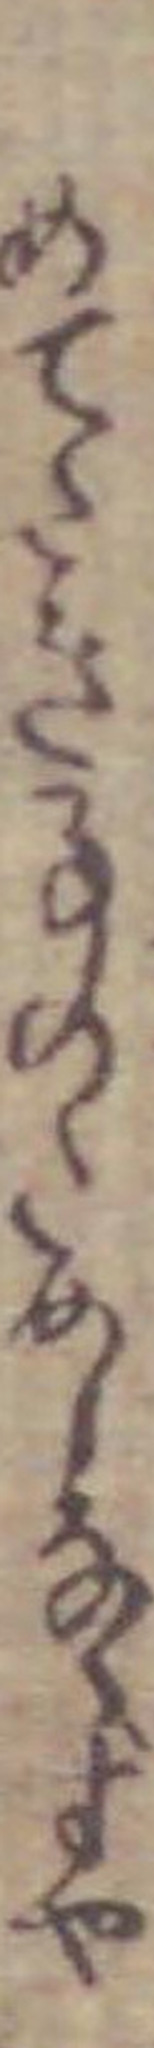めてたき事のためしならずや
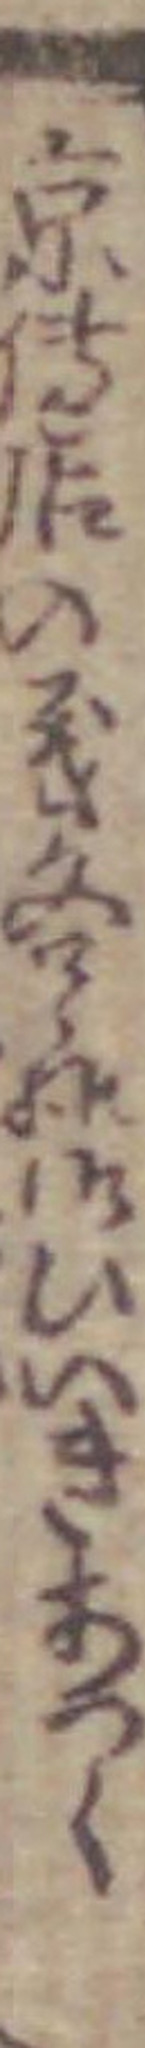〽京伝店の義各々様後ひいきあつく
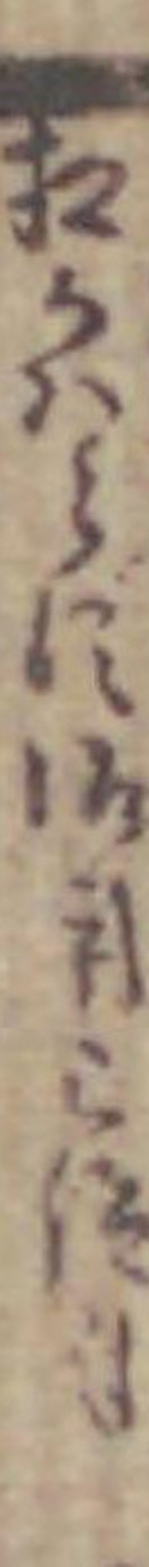相かはらず御用被仰付
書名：和荘兵衛後日話 : 3巻
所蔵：国立国会図書館 National Diet Library, JAPAN
